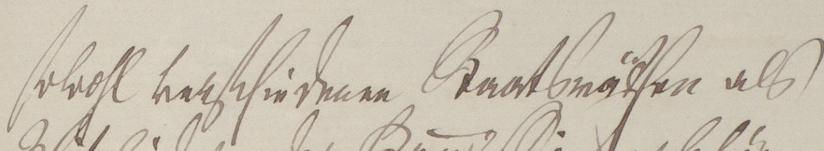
sowohl verschiedenen Staatsräthen als
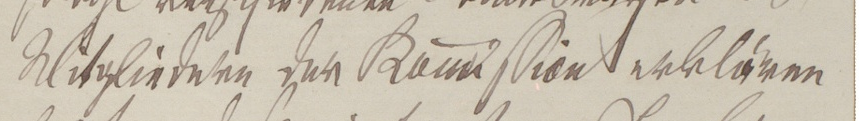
Mitgliedern der Kommission erklären
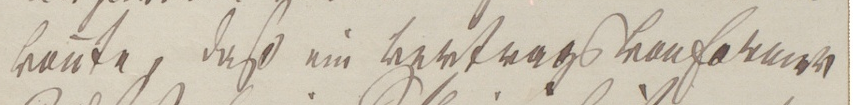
könnte, daß ein vertragskonformer
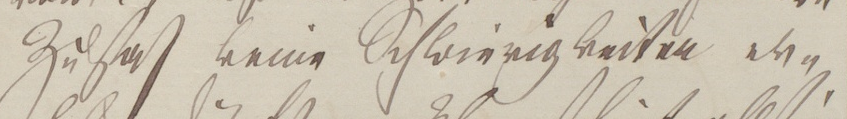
Zusatz keine Schwierigkeiten er-
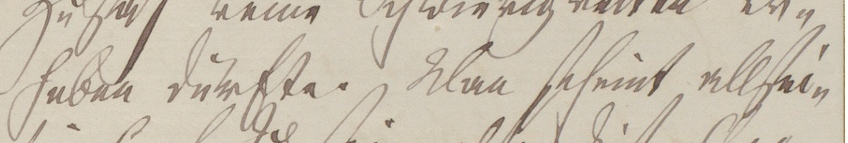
heben dürfte. Man scheint allsei-
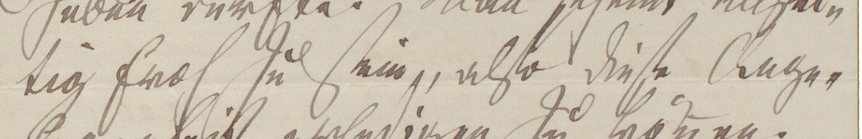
tig froh zu sein, also diese Ange-
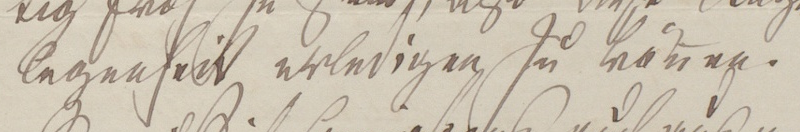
legenheit erledigen zu können.
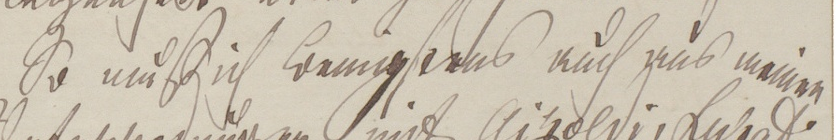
So muß ich wenigstens auch aus meinen
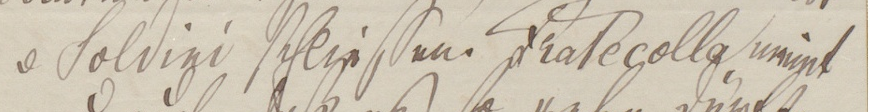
& Soldini schliessen. Fratecolla meint
